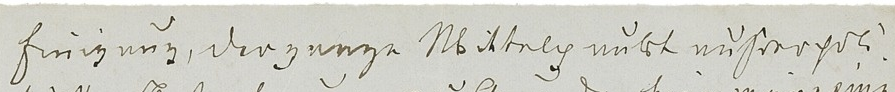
Einigung, der ganze Mittelpunkt unsrer politi-
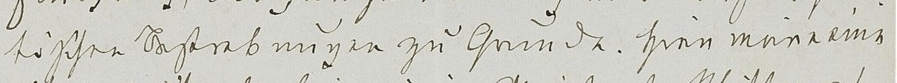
schen Bestrebungen zu Grunde. Hier wäre eine
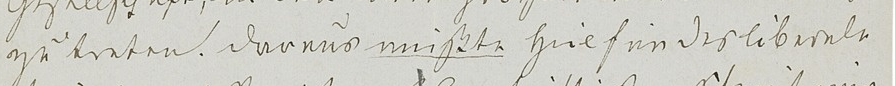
zu treten! Daraus müßte Heil für das liberale
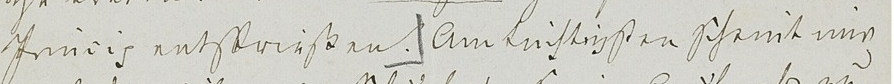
Princip entsprießen. Am tüchtigsten scheint mir
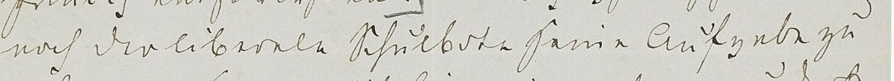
noch der liberale Schulbote seine Aufgaben zu
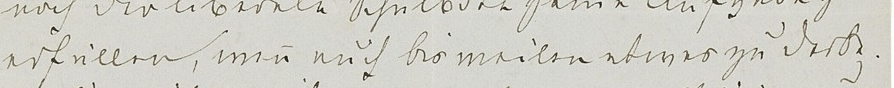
erfüllen, wenn auch bisweilen etwas zu derbe.
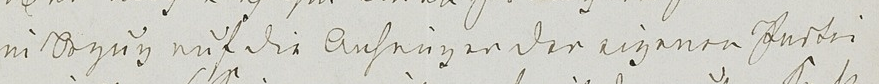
in Bezug auf die Anhänger der eigenen Partei
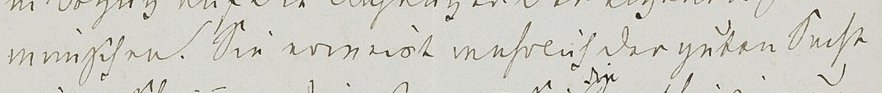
wünschen. Sie erweist wahrlich der guten Sache
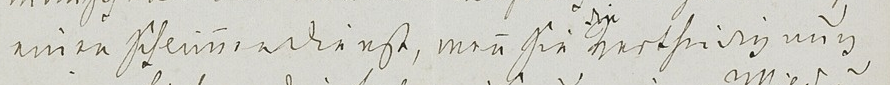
einen schlimmen Dienst, wenn sie die Vertheidigung
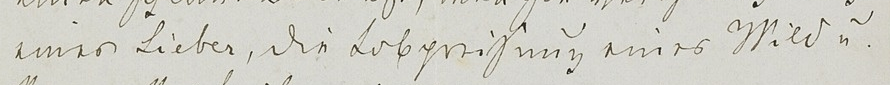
eines Sieber, die Lobpreisung eines Wild u.
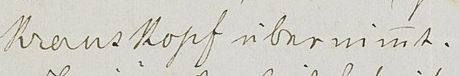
Krauskopf übernimmt.
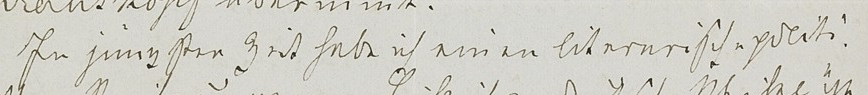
In jüngster Zeit habe ich einen literarisch-politi-
